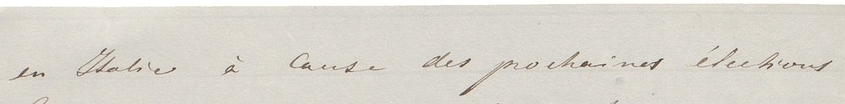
en Italie à cause des prochaines élections
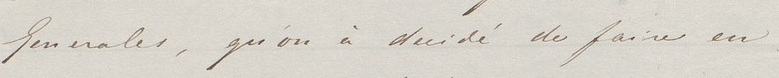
Generales, qu'on à decidé de faire en
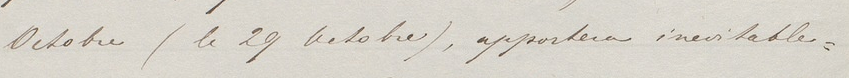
Octobre (le 29 Octobre), apportera inevitable-
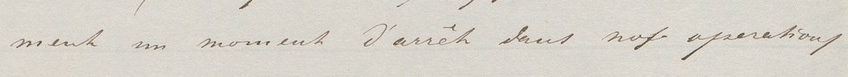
ment un moment d'arrêt dans nos operations
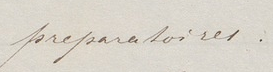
preparatoires.
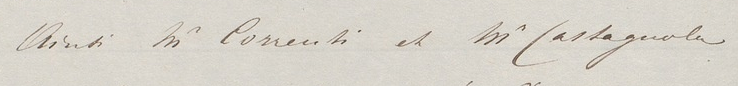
Ainsi MrCorrenti et MrCastagnola
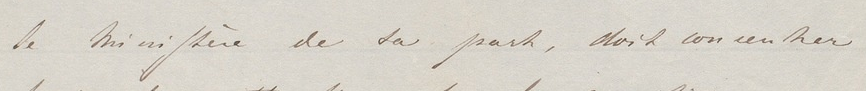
le Ministère de sa part, doit concentrer
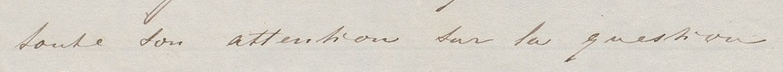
toute son attention sur la question
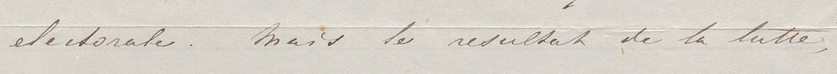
electorale. Mais le resultat de la lutte,
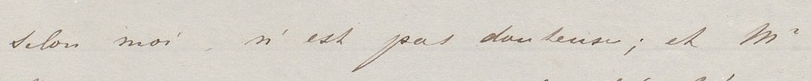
selon moi, n'est pas douteux; et Mr
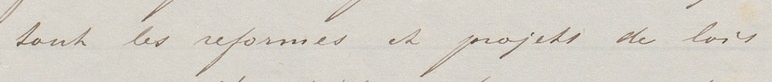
tout les reformes et projets de lois
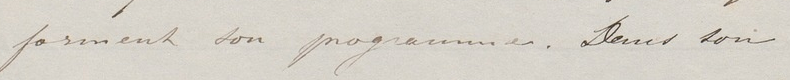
forment son programme. Dans son
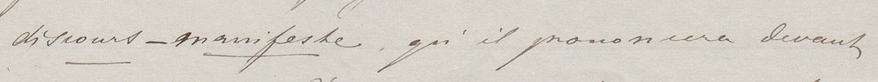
discours-manifeste, qu'il prononcera devant
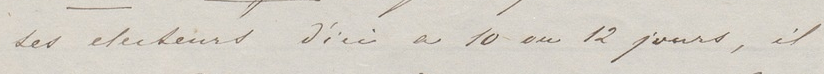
ses electeurs d'ici a 10 ou 12 jours, il
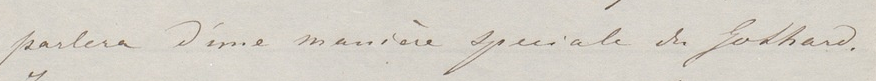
parlera d'une manière speciale du Gothard.
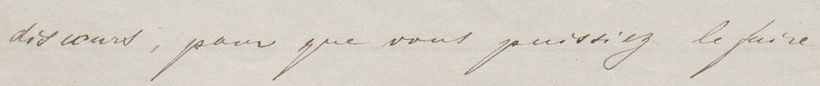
discours, pour que vous puissiez le faire
